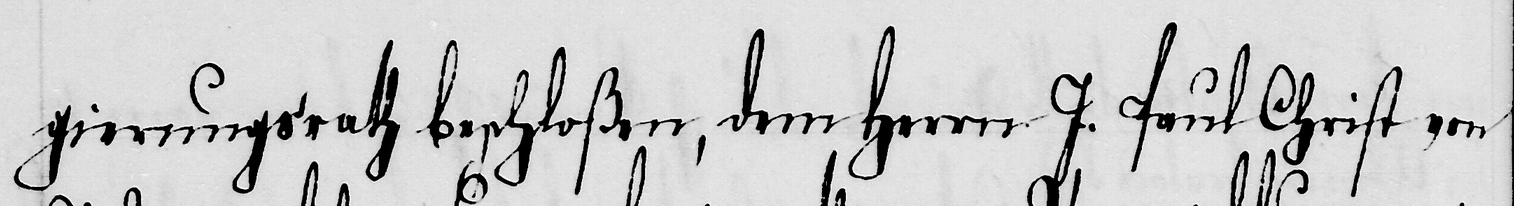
gierungsrath beschloßen, dem Herrn J. Paul Christ von
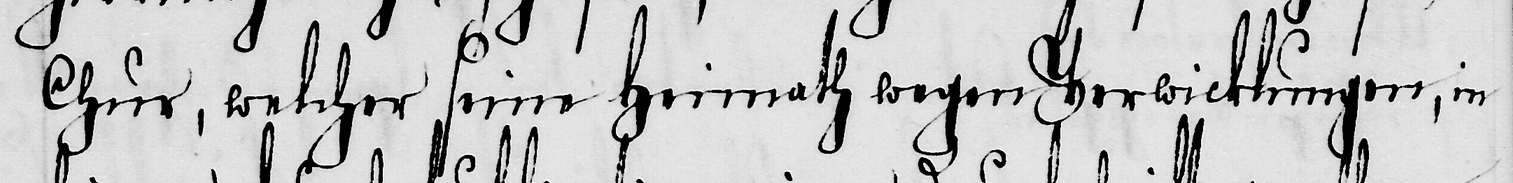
Chur, welcher seine Heimath wegen Verwicklungen, in
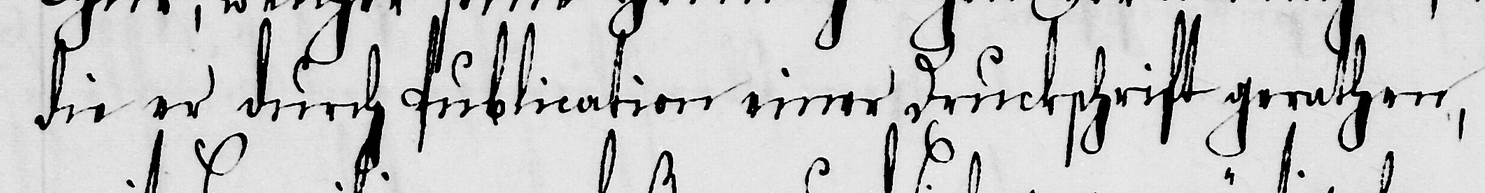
die er durch Publication einer Druckschrift gerathen,
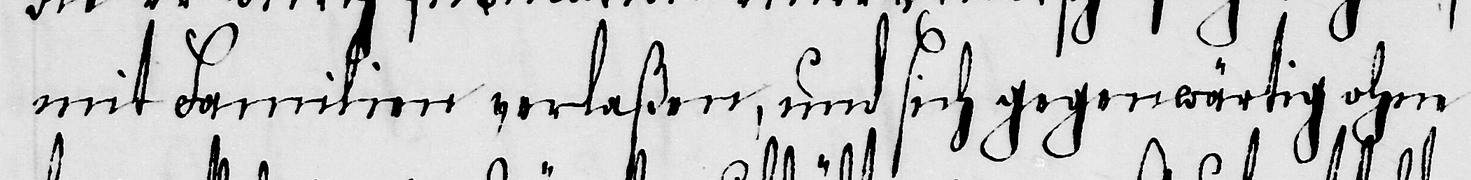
mit Familien verlaßen, und sich gegenwärtig ohne
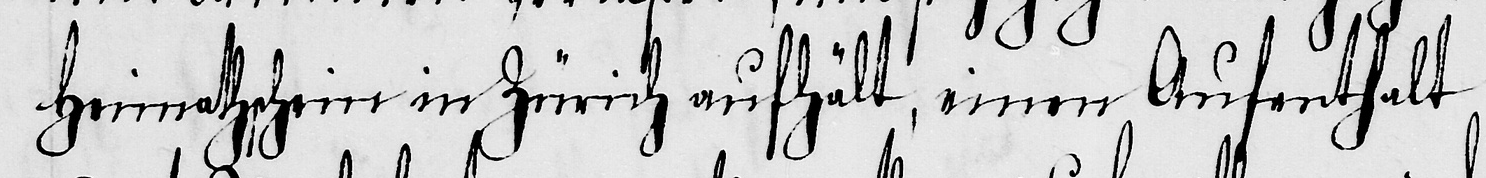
Heimathschein in Zürich aufhält, einen Aufenthalt
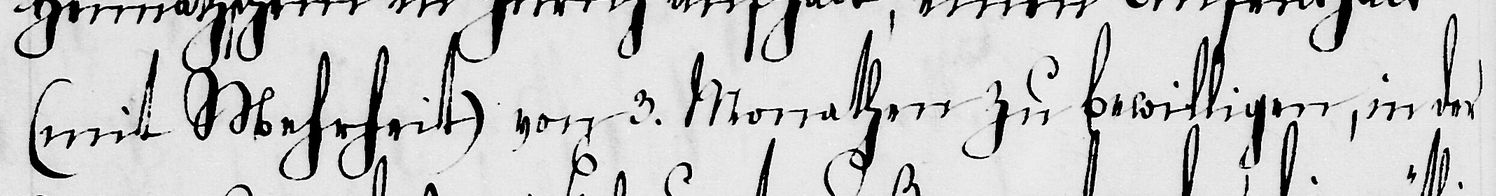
(mit Mehrheit) von 3. Monathen zu bewilligen, in der
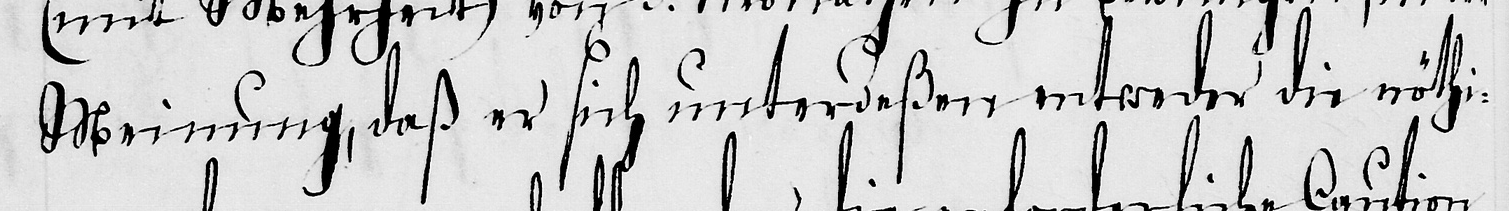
Meinung, daß er sich unterdeßen entweder die nöthi¬
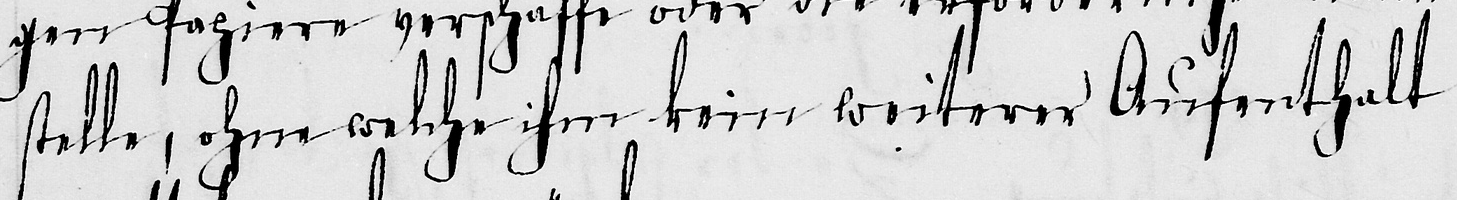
stelle, ohne welche ihm kein weiterer Aufenthalt
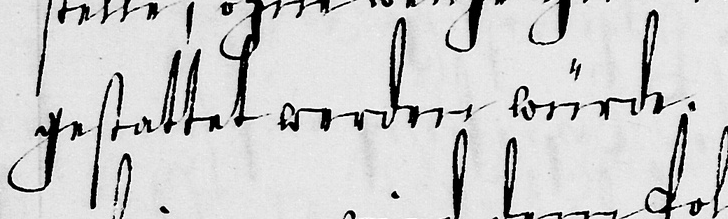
gestattet werden würde.
